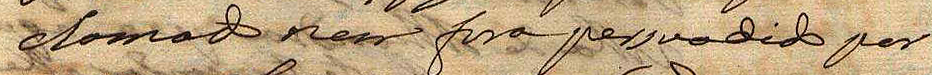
chamado nem fora persuadido por
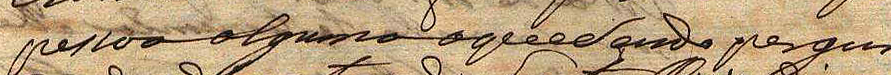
pessoa alguma a que sendo pergun
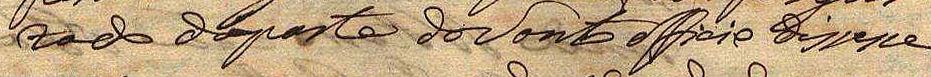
tado da parte do Santo officio dissesse
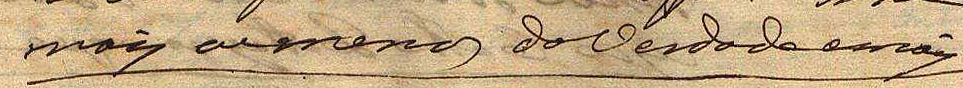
mais ou menos da Verdade e mais
